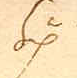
Lxa
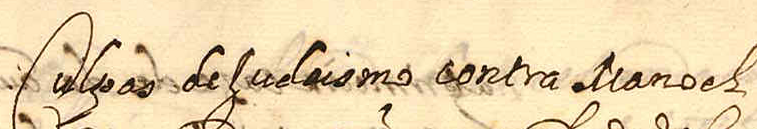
Culpas de Judaismo contra Manoel
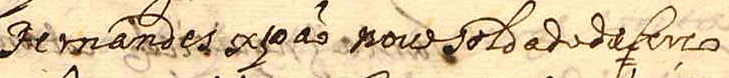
Fernandes xpaõ nouo soldado do terço
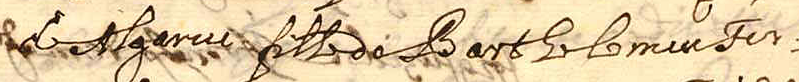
do Algarue filho de Bartholomeu Fer
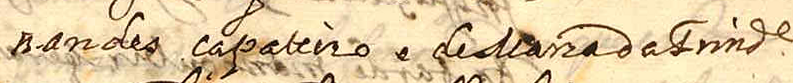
nandes çapateiro e de Maria da Trind.e
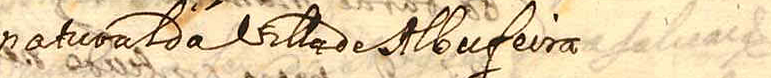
natural da Villa de Albufeira
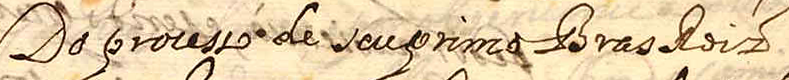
Do processo de seu primo Bras Roiz̄
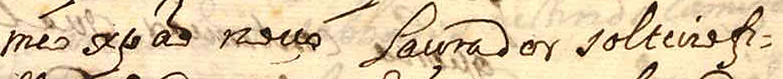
meo xpaõ nouo Lavrador solteiro fi
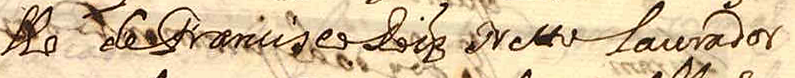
lho de Francisco Roiz̄ Netto laurador
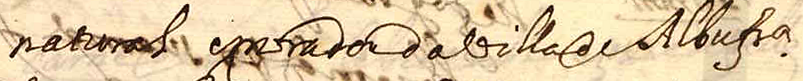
natural e morador da Villa de Albufr.a
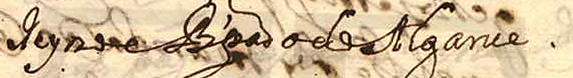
Reyno e Bispado do Algarue.
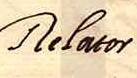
Relator
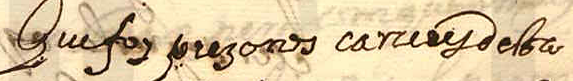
Que foy prezo nos carceres desta
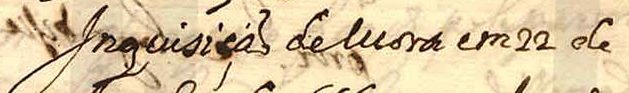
Jnquisiçaõ de Euora em 22 de
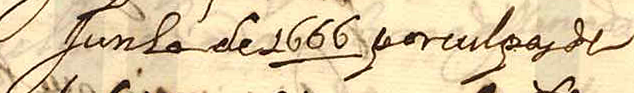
Junho de 1666 por culpas de
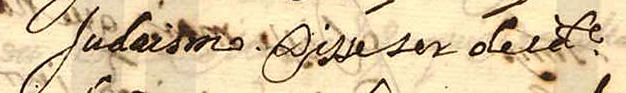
Judaismo. Disse ser de id.e
